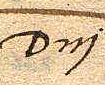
D̄nj
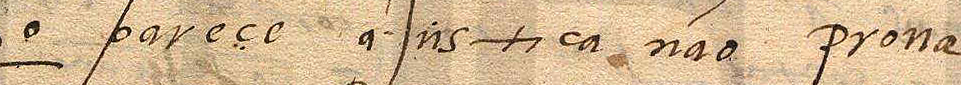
2o parece a Justica não proua
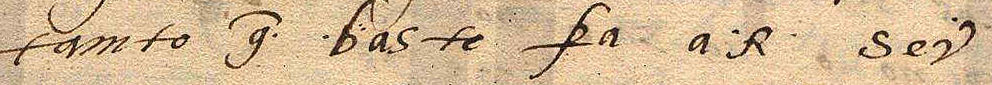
tamto q̄ baste ꝑa a .R. ser
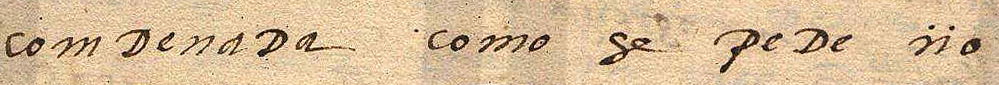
comDenaDa como se peDe no
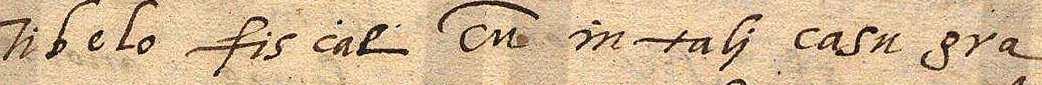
libelo fiscal c̄u in talj casu gra
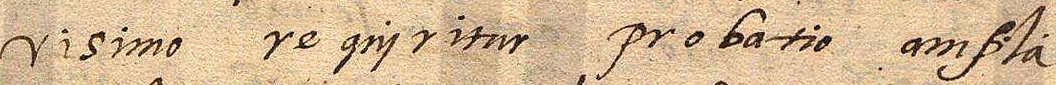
visimo requjritur probatio ampla
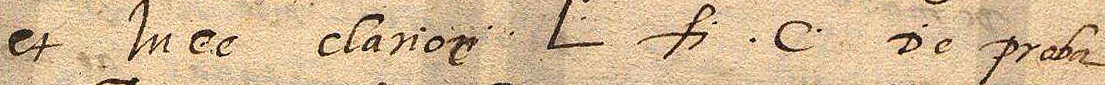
et luce clarior L fi .C. De proba
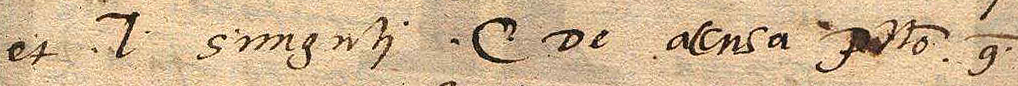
et .l. simgulj .C. De accusa p Nō. q̄.
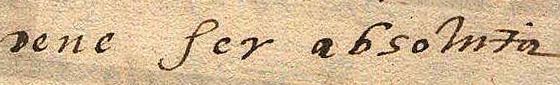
Deue ser absoluta
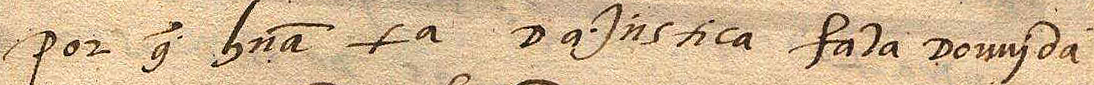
Por q̄ huā ta Da Justica fala Douujda
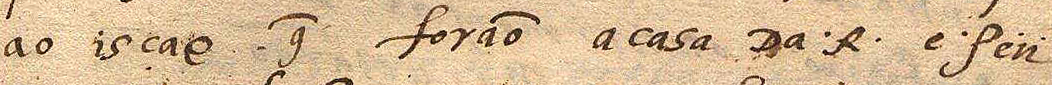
ao iscac .q̄ forão a casa Da .R. e .seu
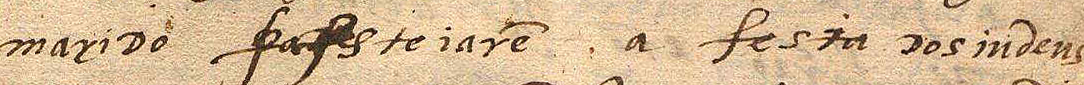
mariDo ꝑa festeiarē a festa dos iudeus
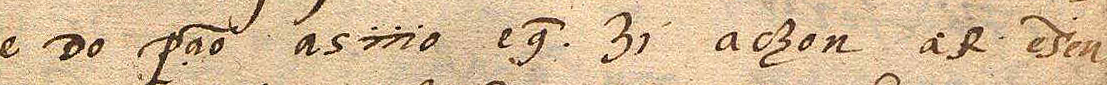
e Do pão asmo e q̄. hi achou a .R. e seu
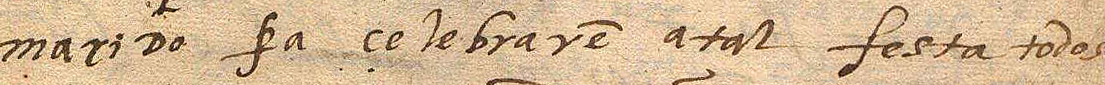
marido ꝑa celebrarē a tal festa todos
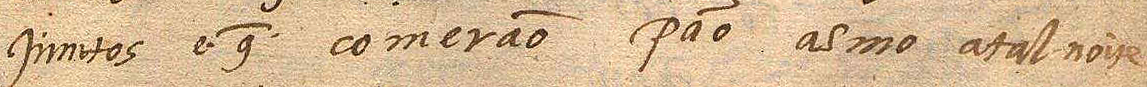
Jumtos e .q̄. comerão pão asmo a tal noite
